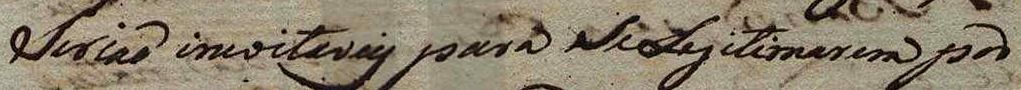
Seriaõ inevitaveis para Se Legitimarem por
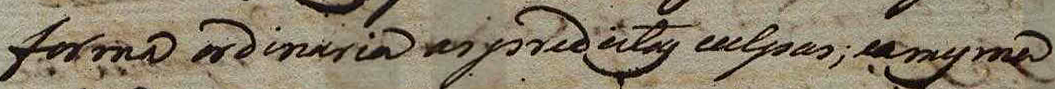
forma ordinaria as predictas culpas; e a mesma
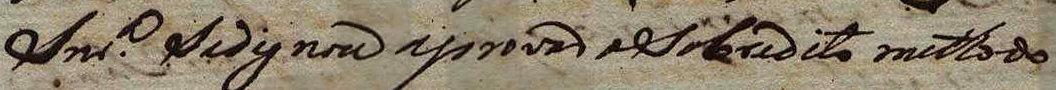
Snr.a Se dignou aprovar o Sobredito methodo
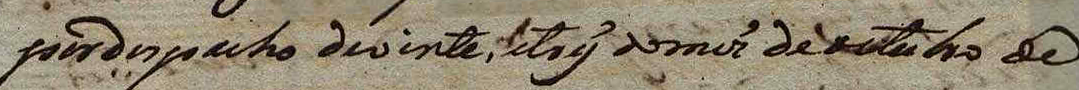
por despacho de vinte, e tres do mez de octubro de
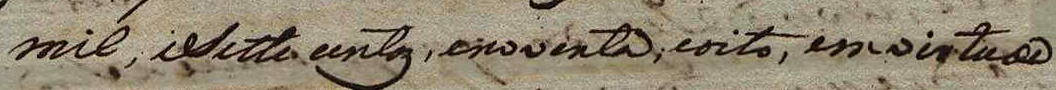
mil, e Settecentoz, e noventa, e oito, em virtude
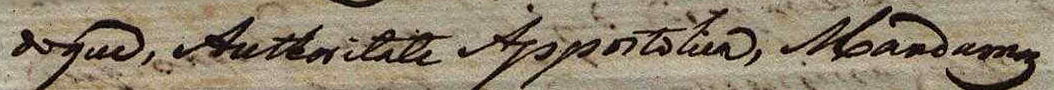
do que, Authoritate Appostolica, Mandamoz
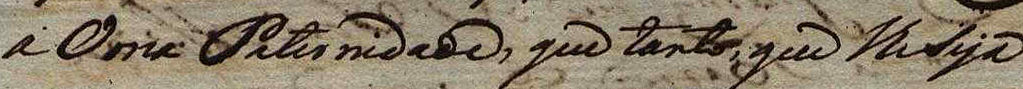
a Vossa Paternidade, que tanto, que lhe Seja
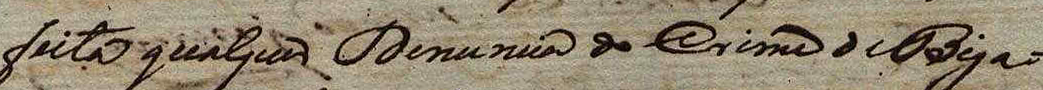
feita qualquer Denuncia do Crime de Biga
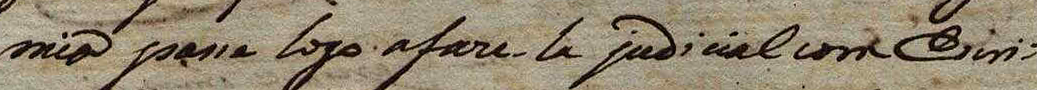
mia possa logo a faze-la judicial com Escri
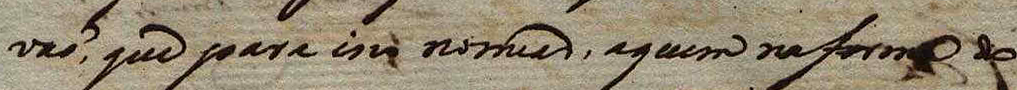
vaõ, que para isso nomear, a quem na forma do
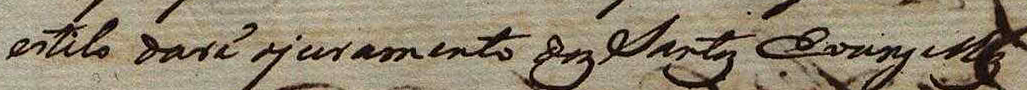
estilo dará juramento doz Santoz Evangelh_z
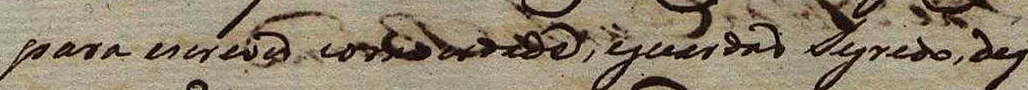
para escrever com verdade, e guardar Segredo, de q̄
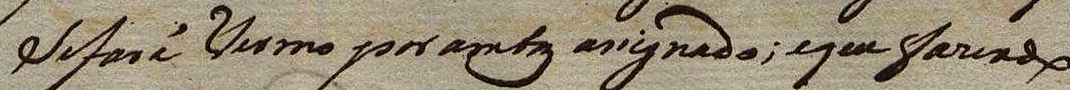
Se fará Termo por amboz assignado; e que fazendo
